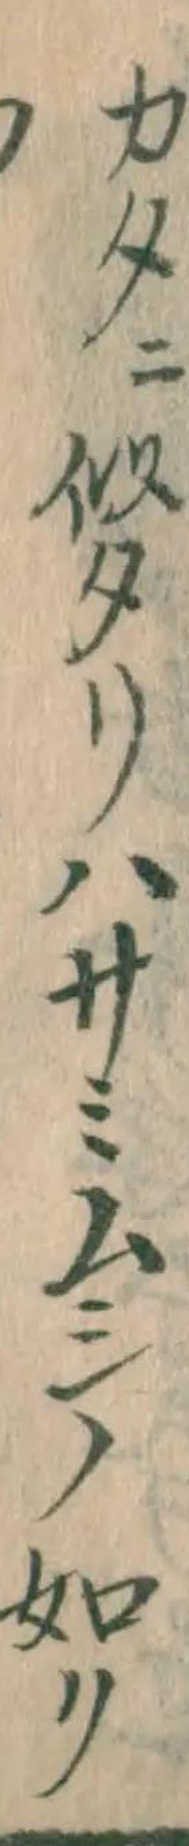ガタニ似タリハサミムシノ如ク
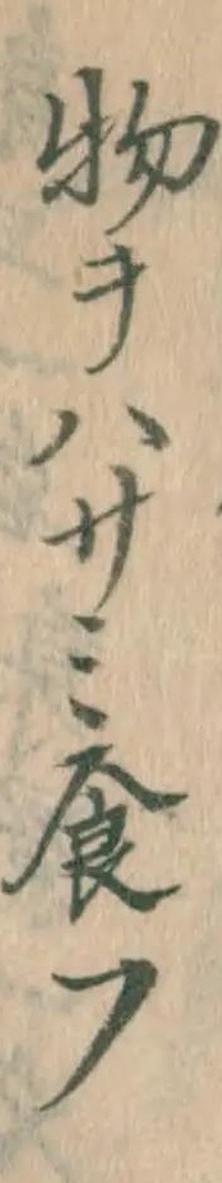物ヲハサミ食フ
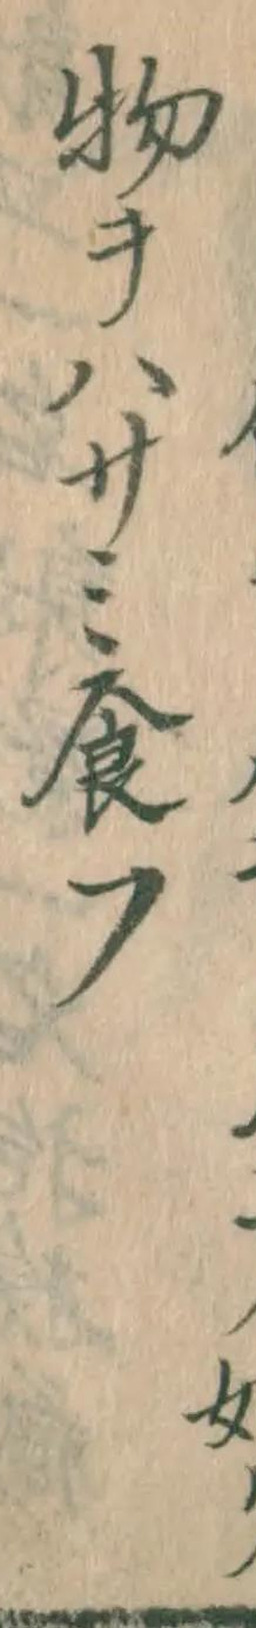物ヲハサミ食フ

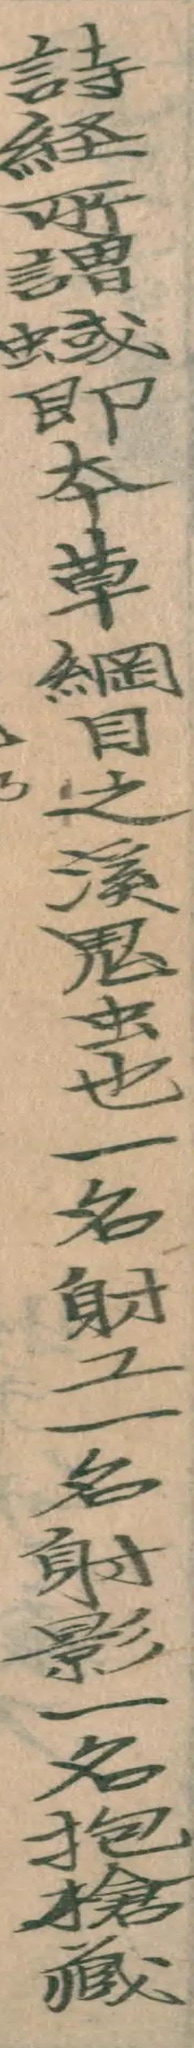詩経所謂蜮即本草綱目之溪鬼虫也一名射工一名射影一名抱槍藏
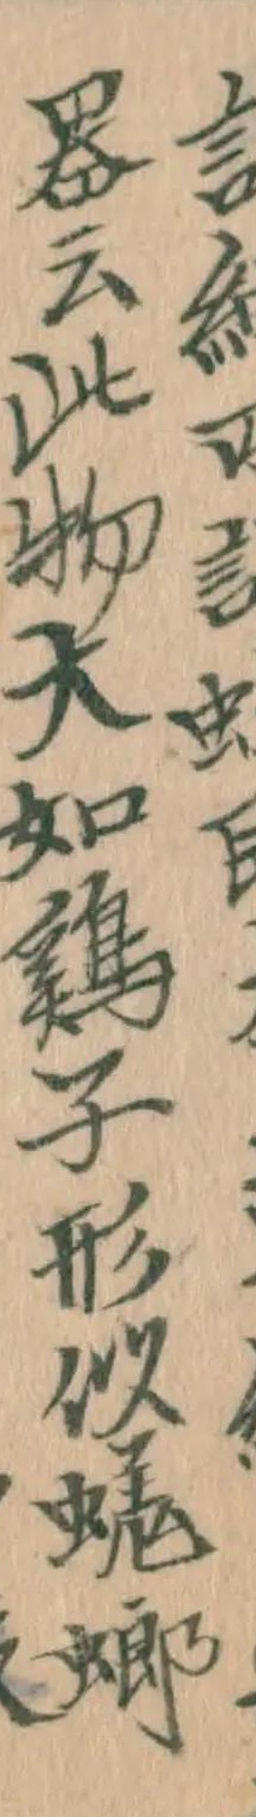器云此物大如鶏子形似蜣螂
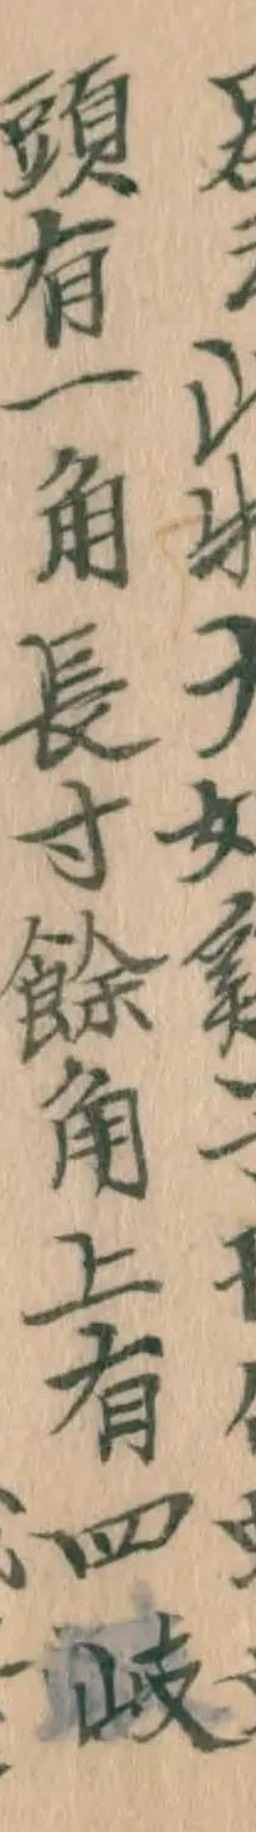頭有一角長寸餘角上有四岐
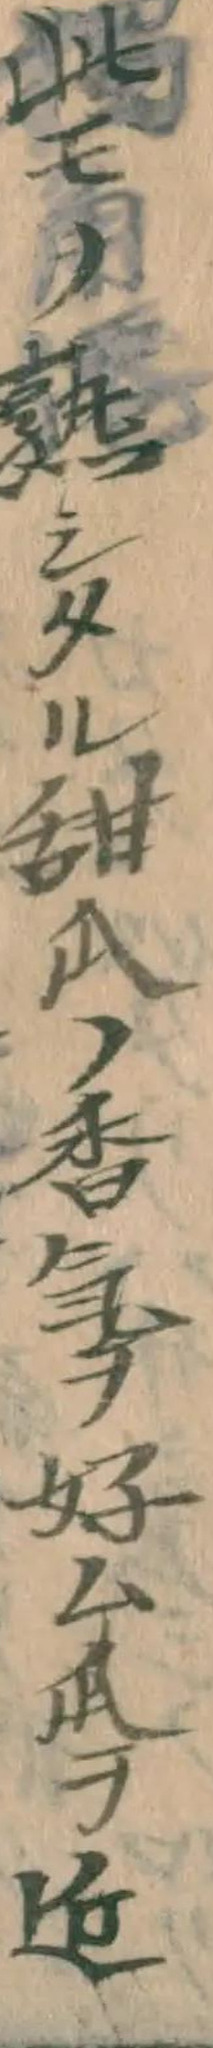此モノ熟シタル甜瓜ノ香気ヲ好ム瓜ヲ近
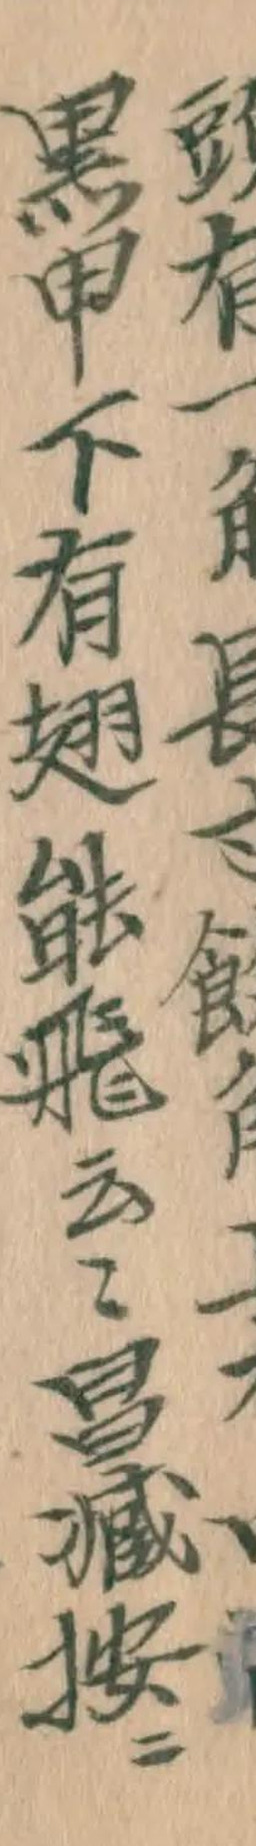黒甲下有翅能飛云々昌臧按ニ
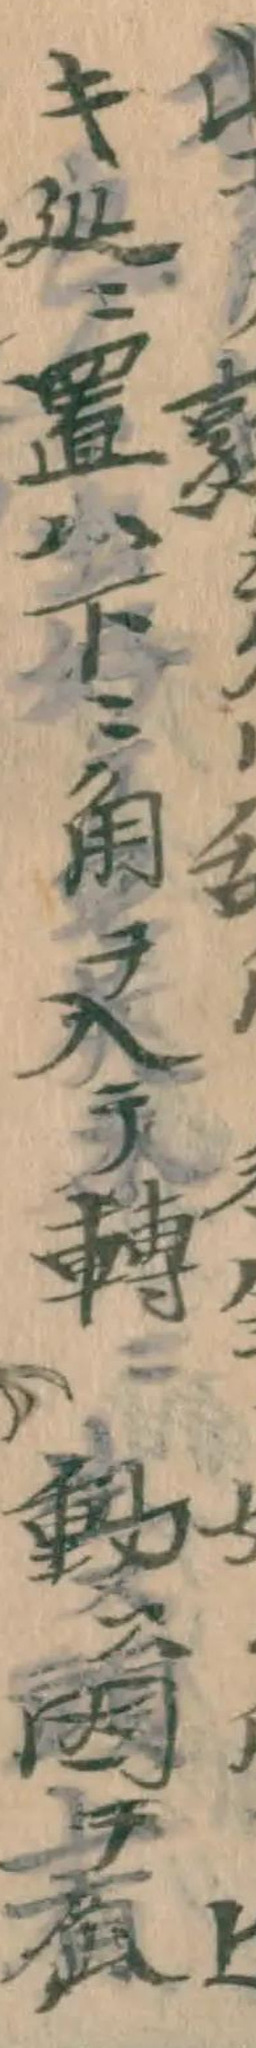キ処ニ置ハ下ニ角ヲ入テ轉動ス因テ瓜
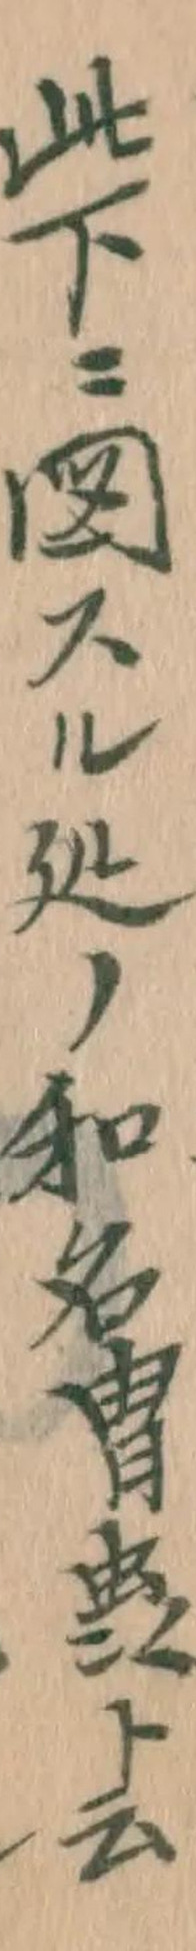此下ニ図スル処ノ和名冑蟲ト云
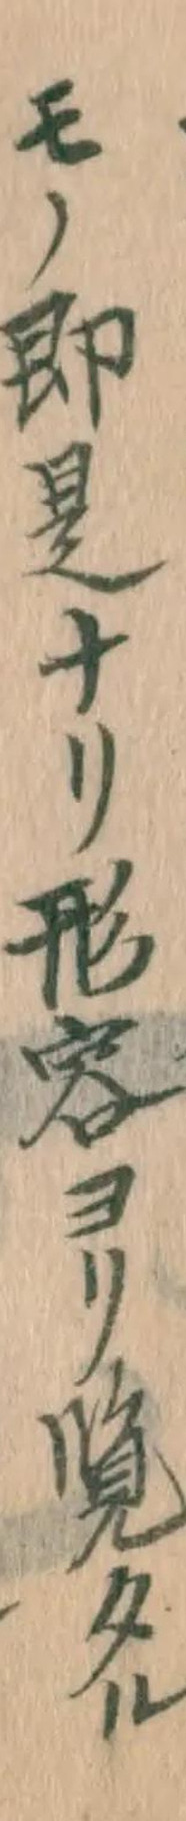モノ即是ナリ形容ヨリ覧タル
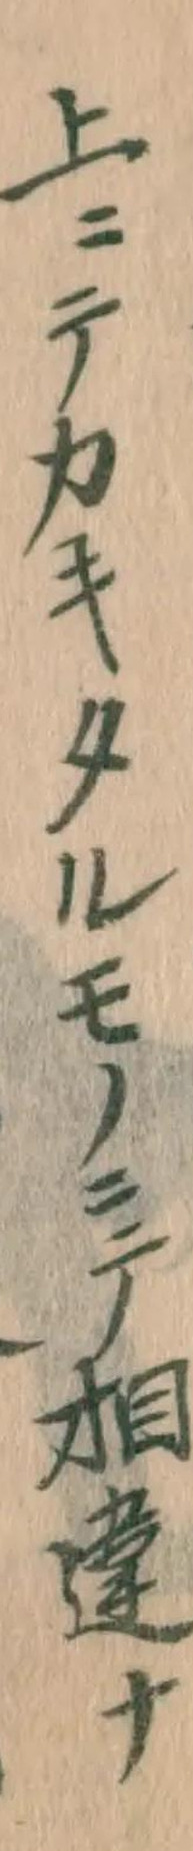上ニテカキタルモノニテ相違ナ
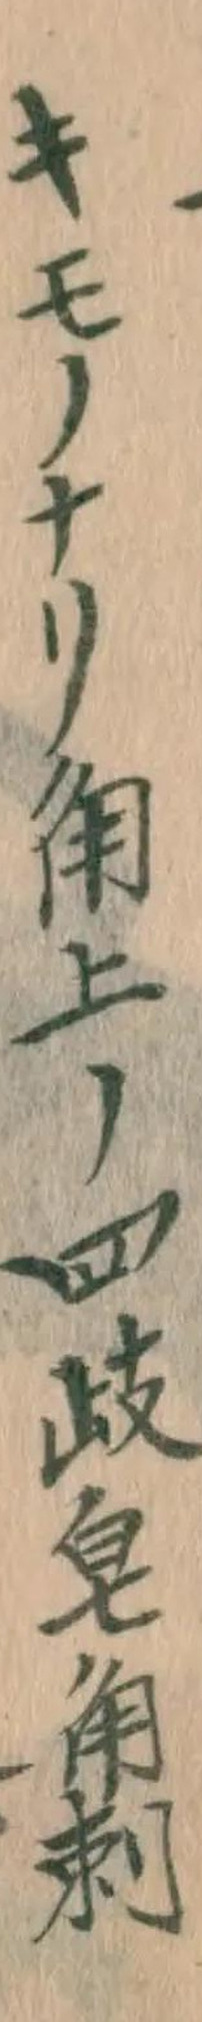キモノナリ角上ノ四岐皂角刺
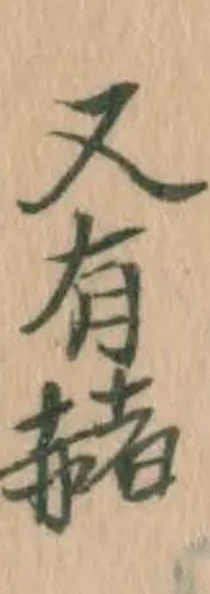又有赭
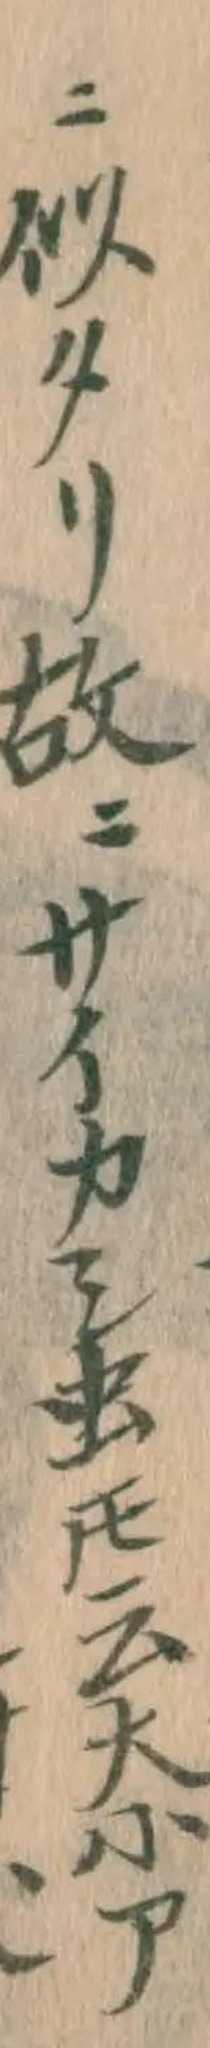ニ似タリ故ニサイカシ虫トモ云大小ア
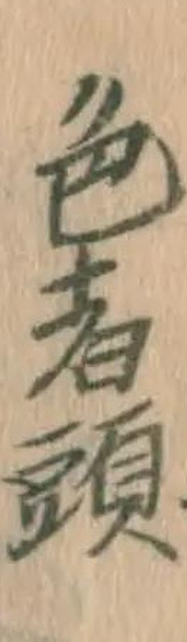色者頭
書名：千蟲譜 3巻. [1]
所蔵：国立国会図書館 National Diet Library, JAPAN
